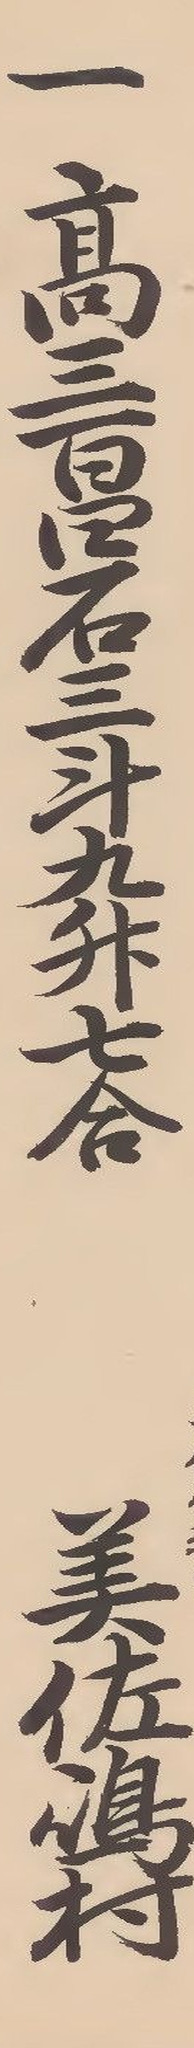一高三百四石三斗九升七合美佐島村
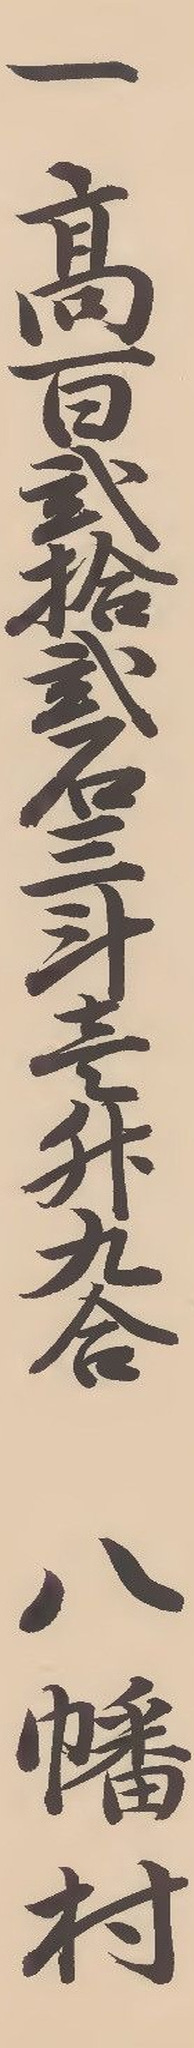一高百弐拾弐石三斗壱升九合八幡村
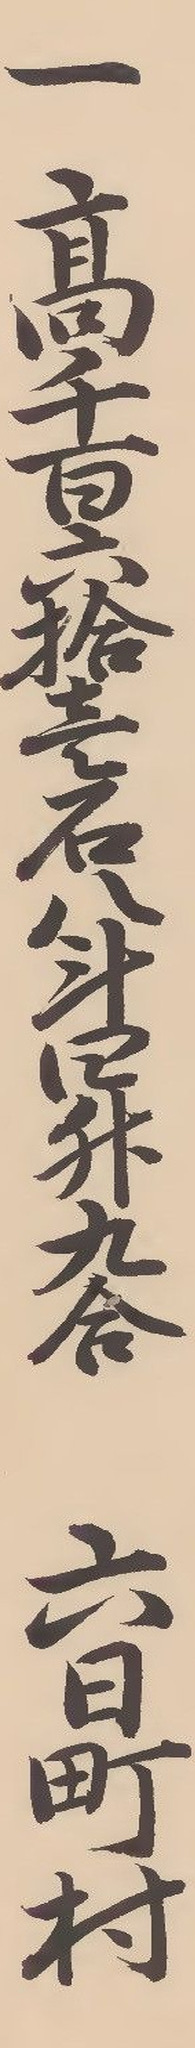一高千百六拾壱石八斗四升九合六日町村

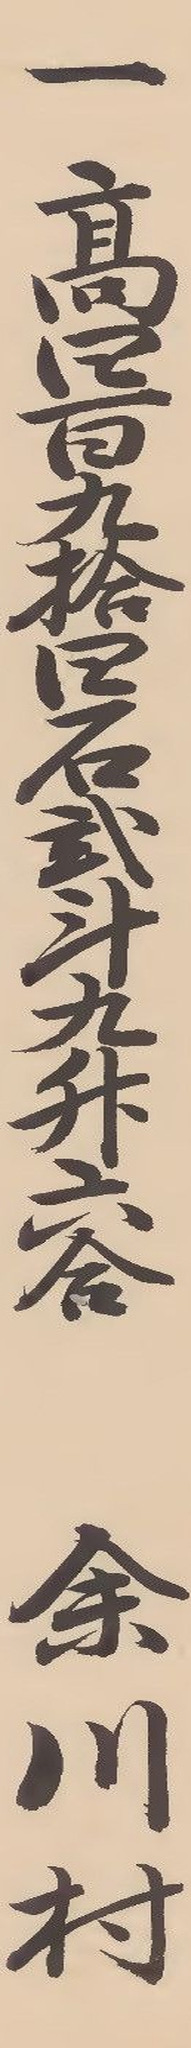一高四百九拾四石弐斗九升六合余川村
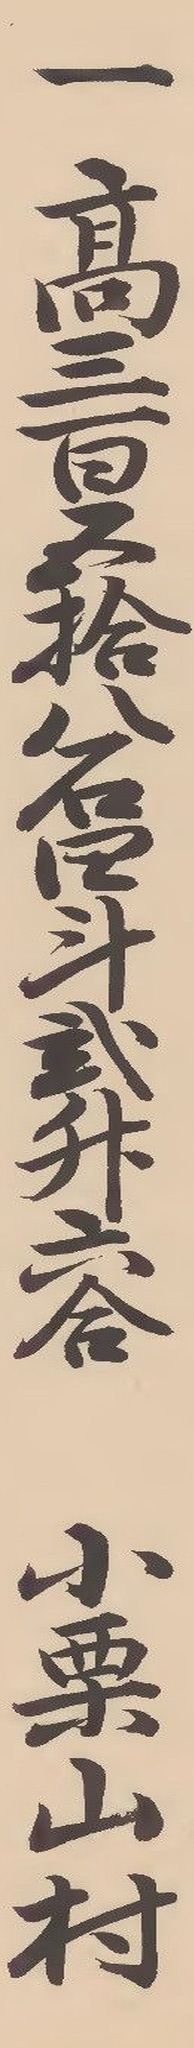一高三百五拾八石四斗弐升六合小栗山村
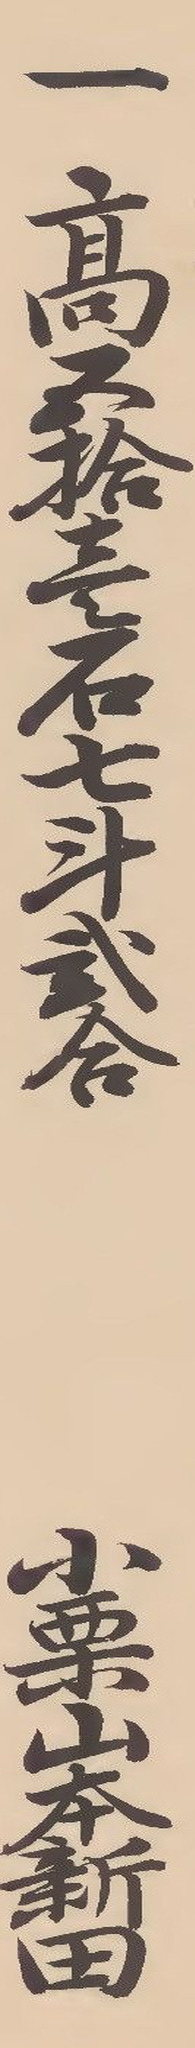一高五拾壱石七斗弐合小栗山本新田
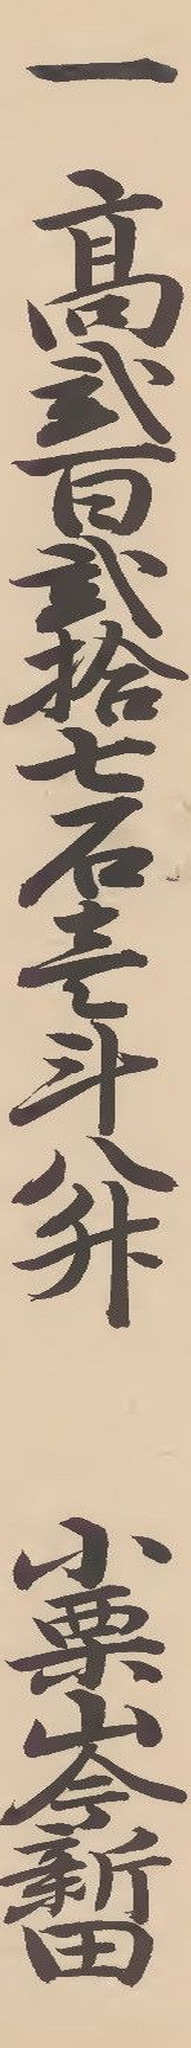一高弐百弐拾七石壱斗八升小栗山今新田
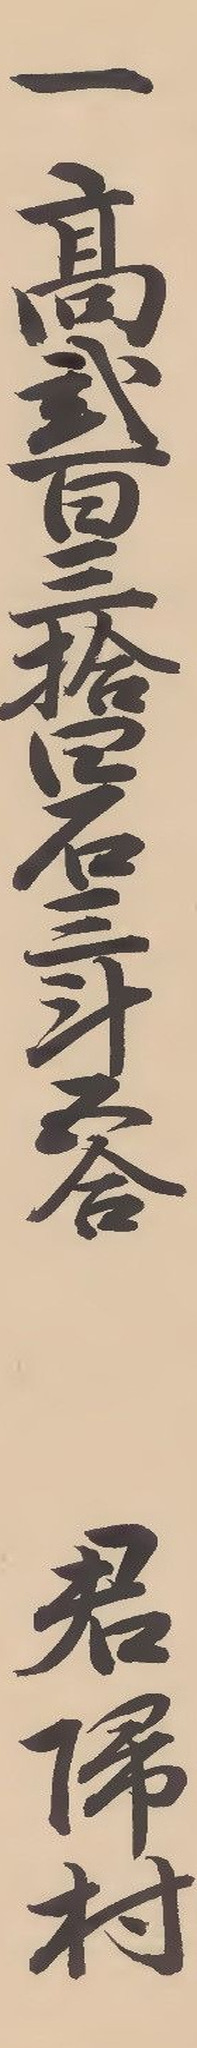一高弐百三拾四石三斗五合君帰村
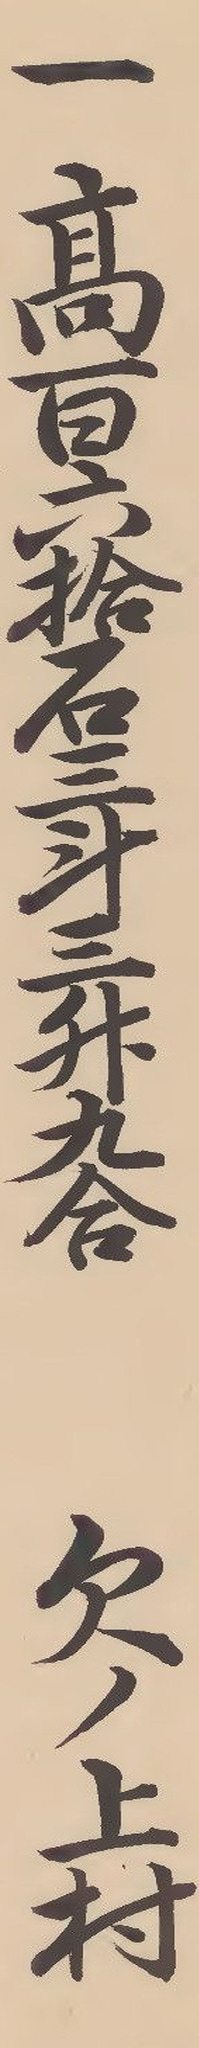一高百六拾石三斗三升九合欠ノ上村
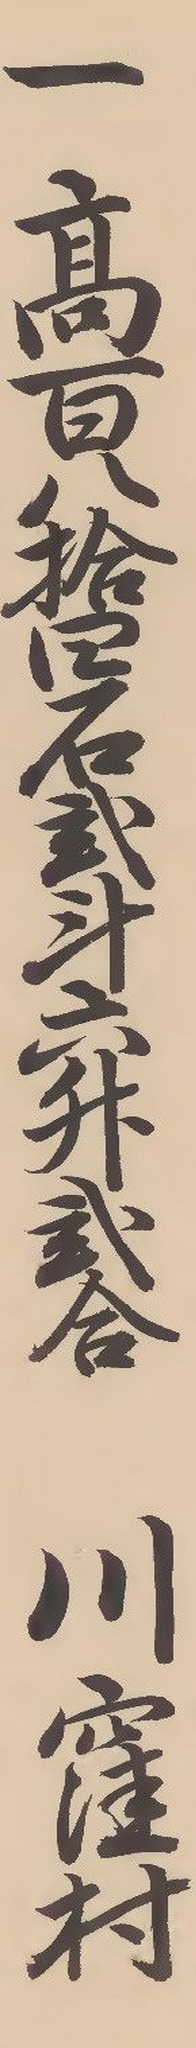一高百八拾四石弐斗六升弐合川窪村

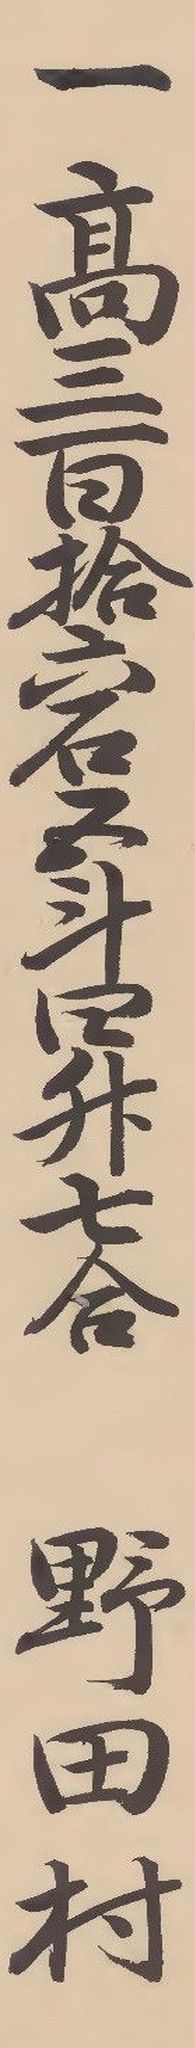一高三百拾六石五斗四升七合野田村
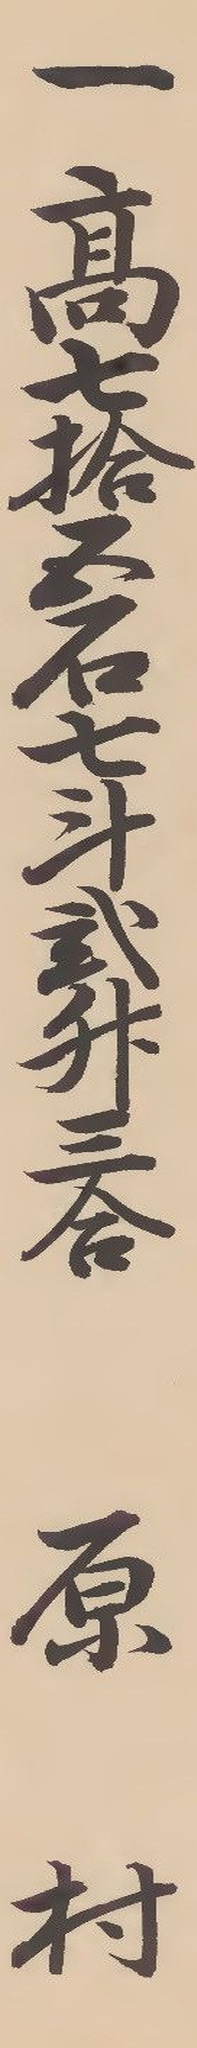一高七拾五石七斗弐升三合原村
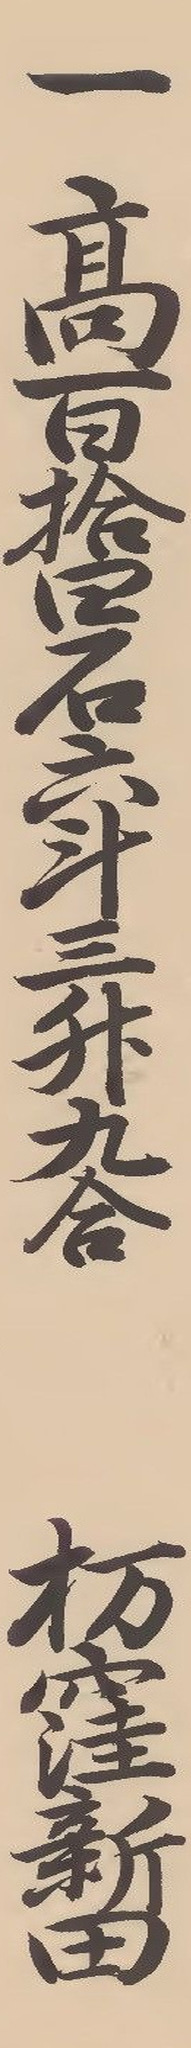一高百拾四石六斗三升九合栃窪新田
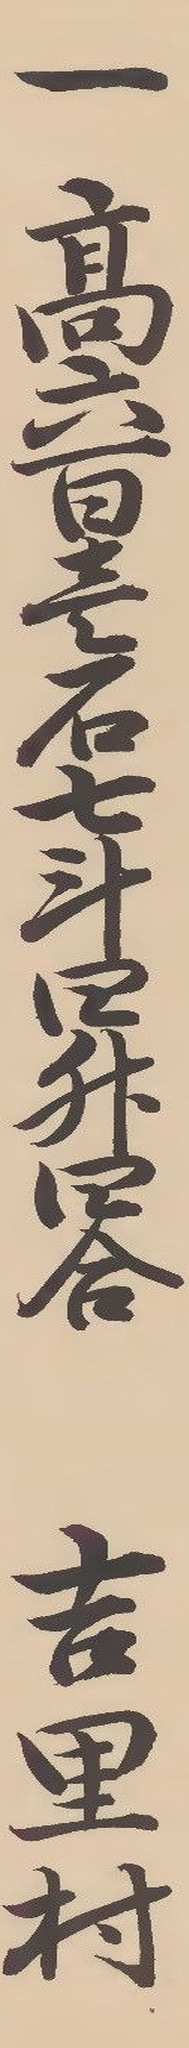一高六百壱石七斗四升四合吉里村
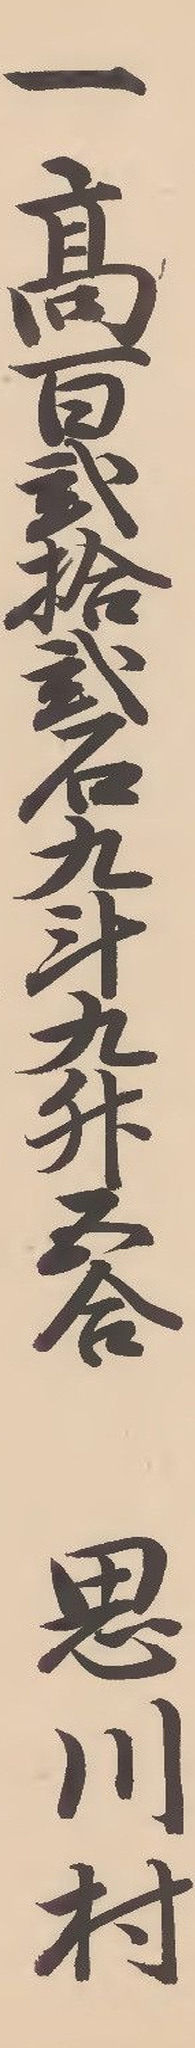一高百弐拾弐石九斗九升五合思川村
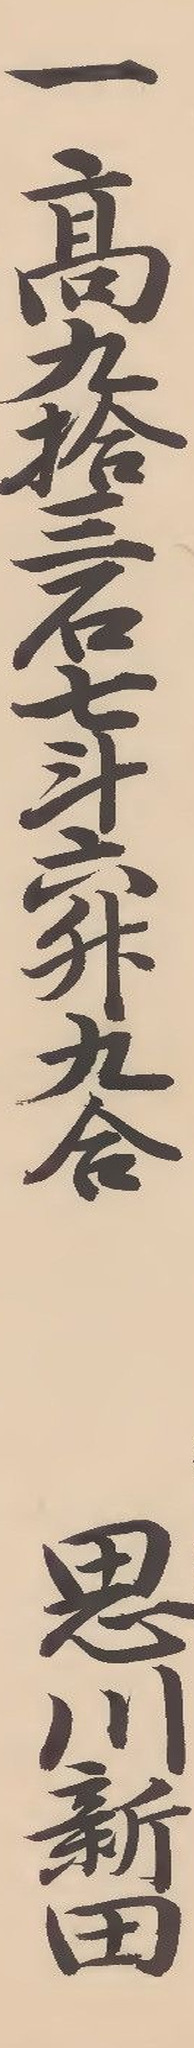一高九拾三石七斗六升九合思川新田
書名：越後国郷帳　中
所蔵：国立公文書館 National Archives of Japan
